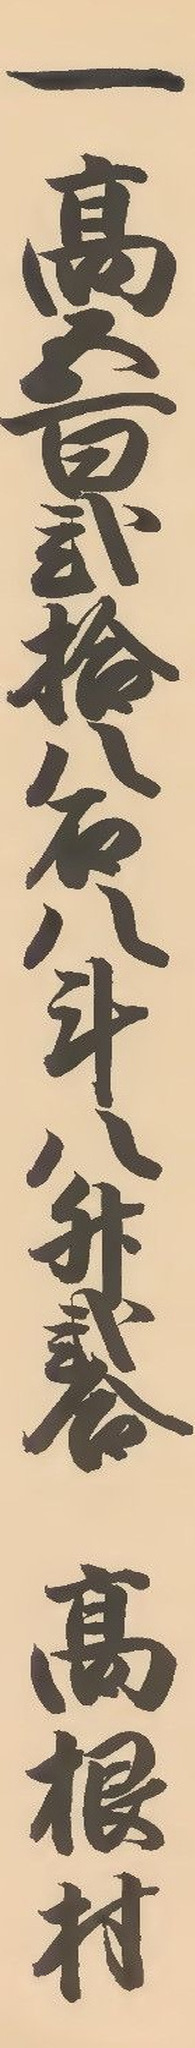一髙五百弐拾八石八斗八升弐合髙根村
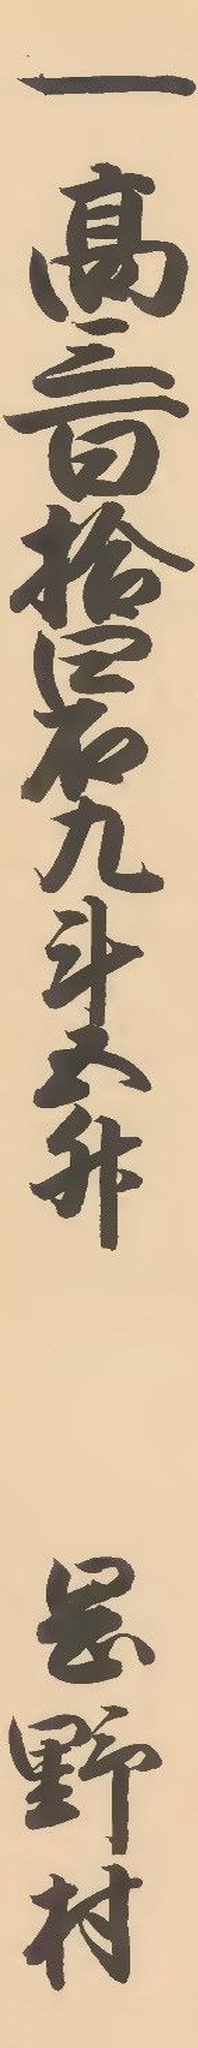一髙三百拾四石九斗五升岡野村

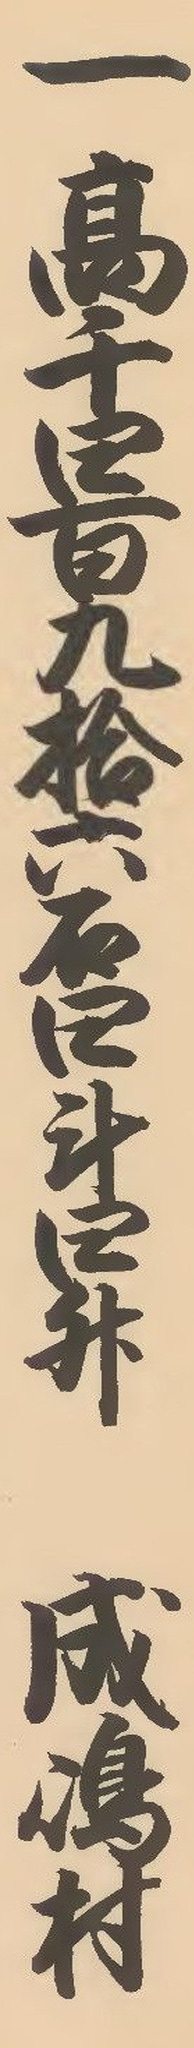一髙千四百九拾六石四斗四升成嶋村
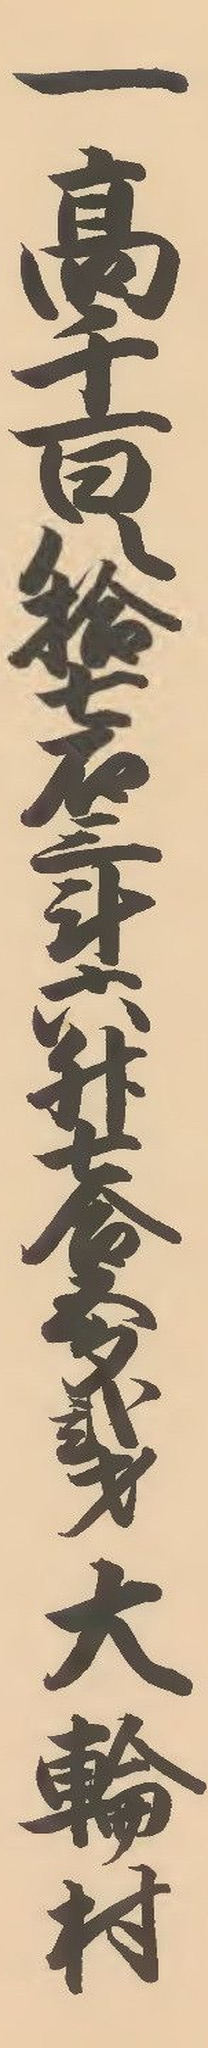一髙千百八拾七石三斗六升七合五夕弐才
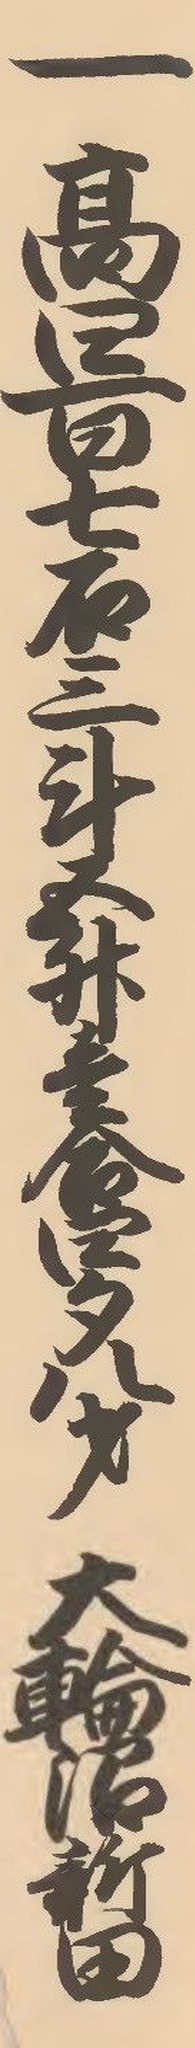一髙四百七石三斗五升壱合四夕八大輪沼新田
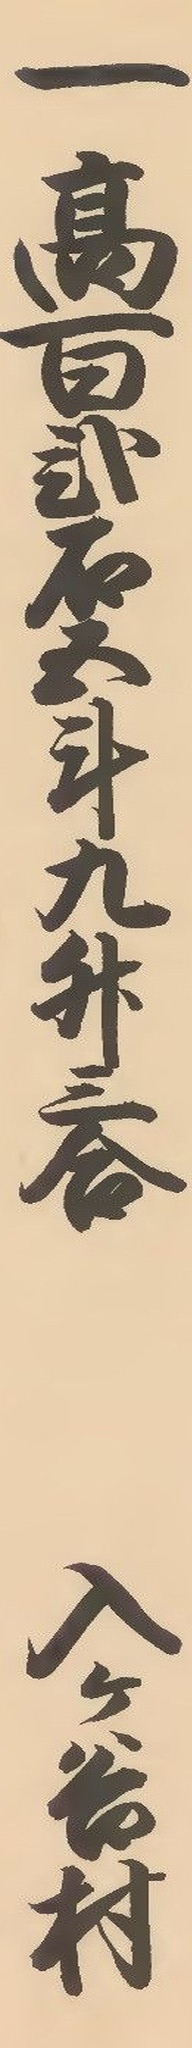一髙百弐石五斗九升三合入ケ谷村
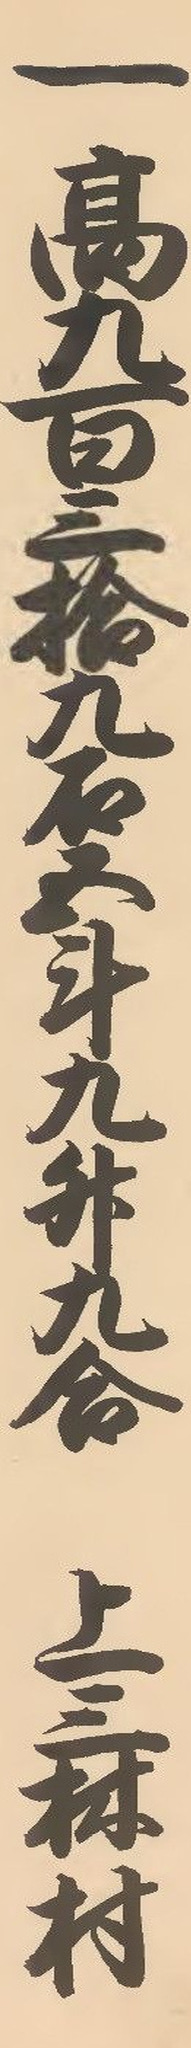一髙九百三拾九石五斗九升九合上三林村
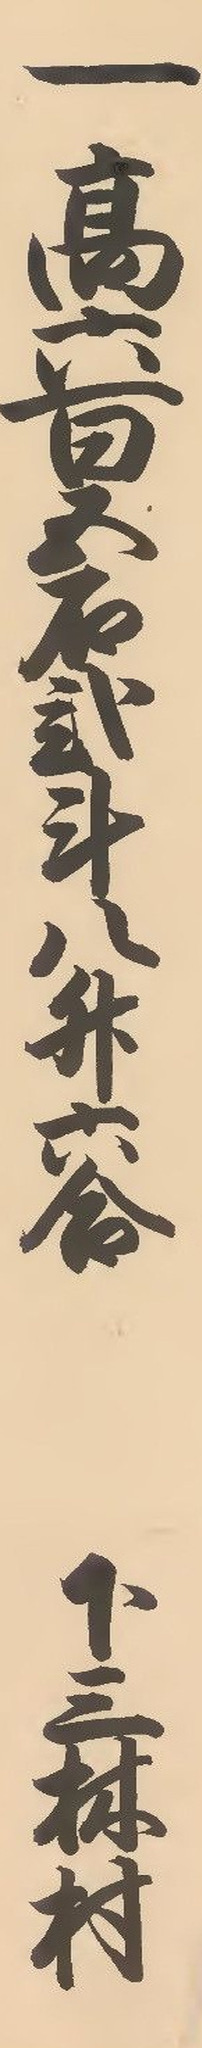一髙六百五石弐斗八升六合下三林村
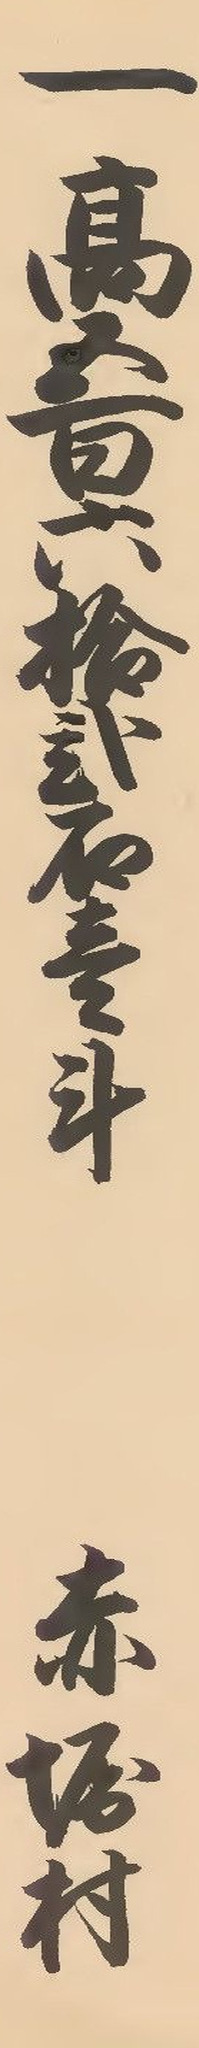一髙五百六拾弐石壱斗赤堀村
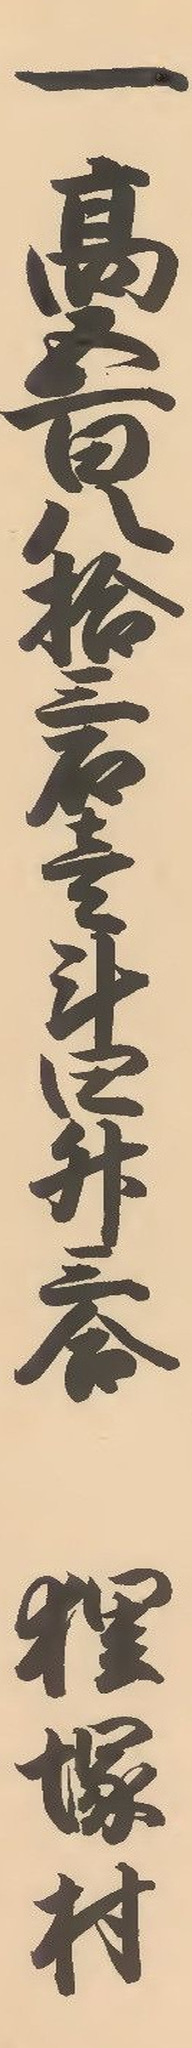一髙五百八拾三石壱斗四升三合狸塚村

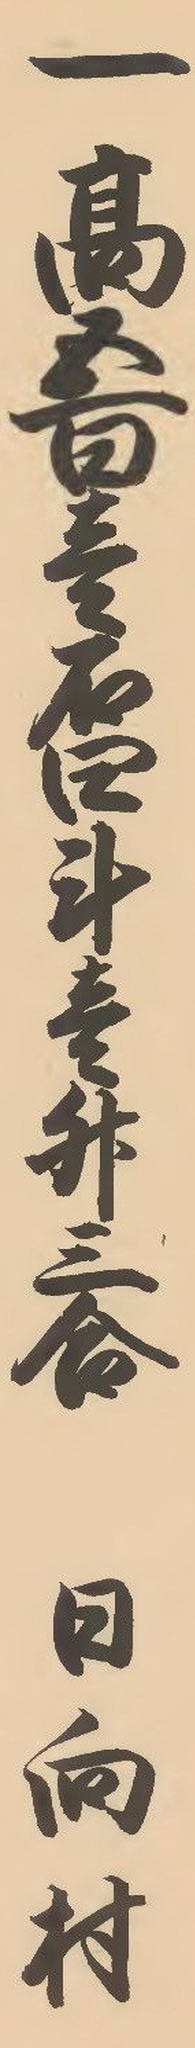一髙五百壱石四斗壱升三合日向村
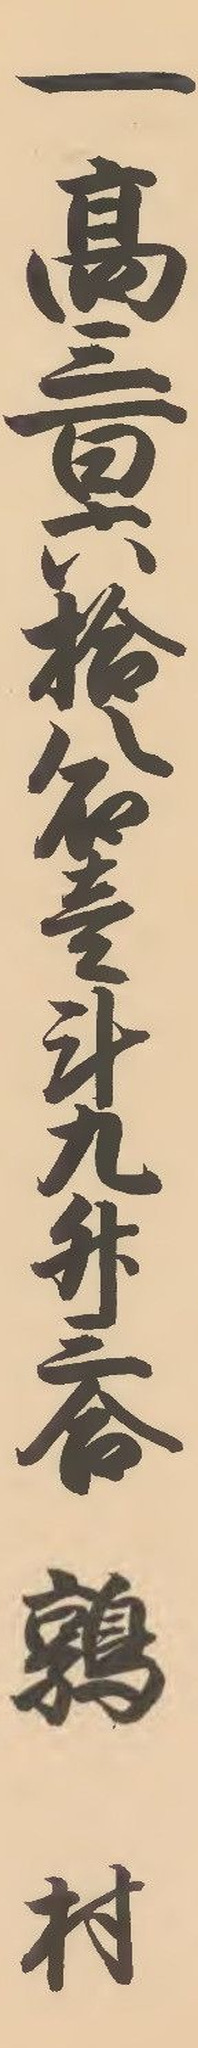一髙三百六拾八石壱斗九升三合鶉村
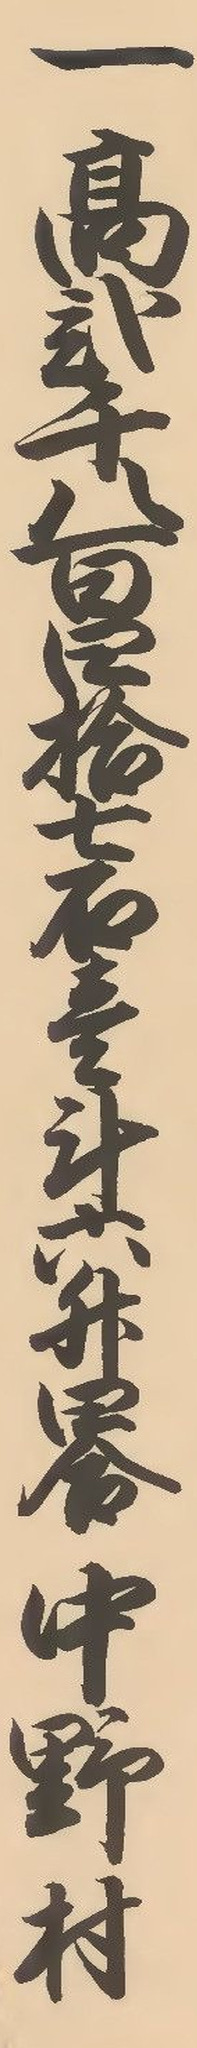一髙弐千八百四拾七石壱斗六升四合中野村
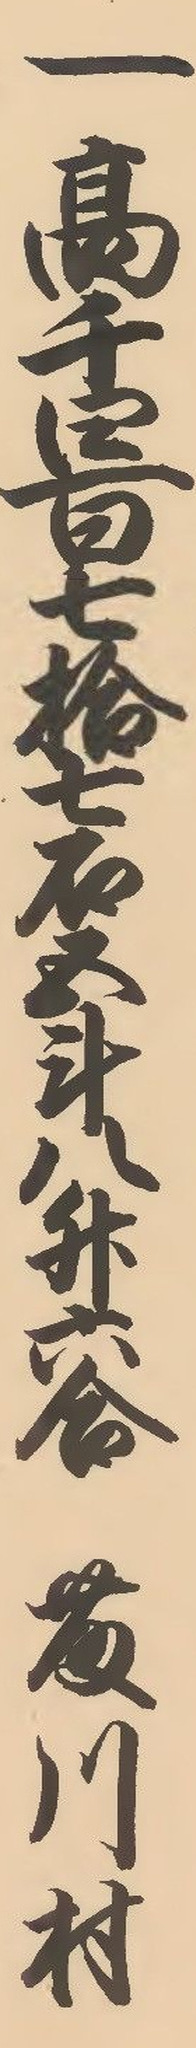一髙千四百七拾七石五斗八升六合藤川村
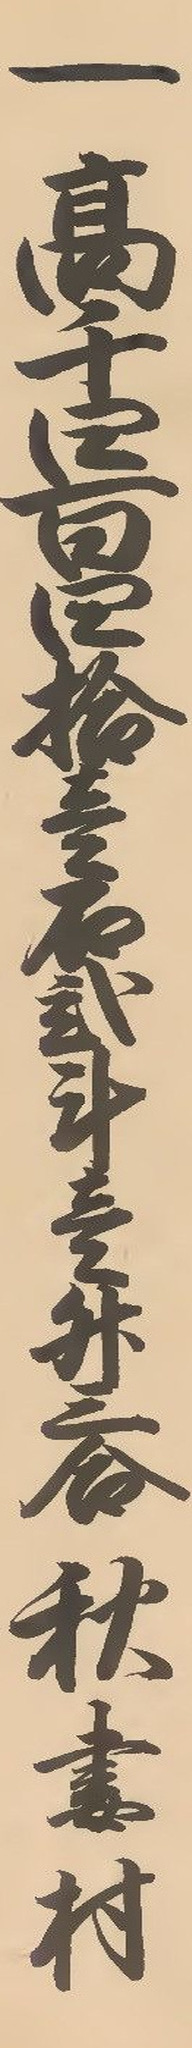一髙千四百四拾壱石弐斗壱升三合秋妻村
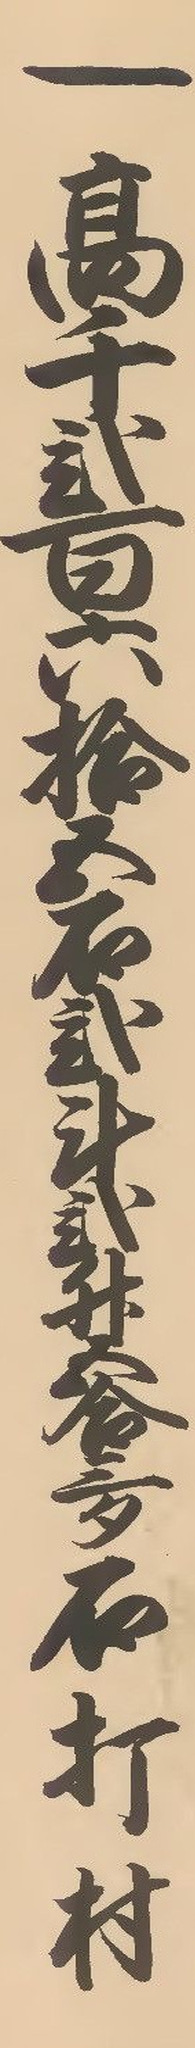一髙千弐百六拾五石弐斗壱升五合三夕石打村
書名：上野国郷帳
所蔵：国立公文書館 National Archives of Japan
